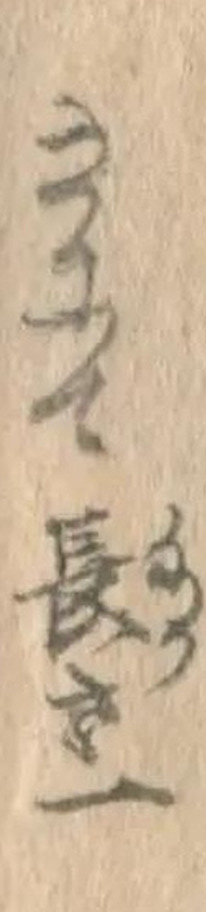さにて長さ一
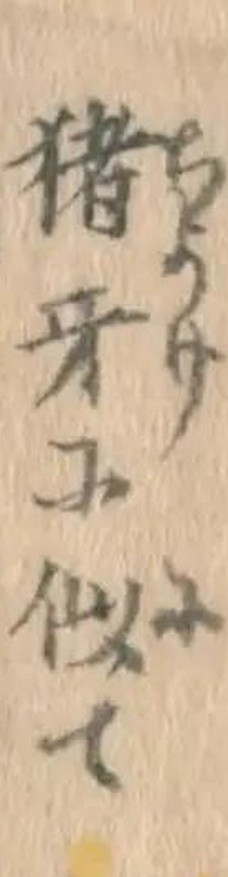猪牙に似て
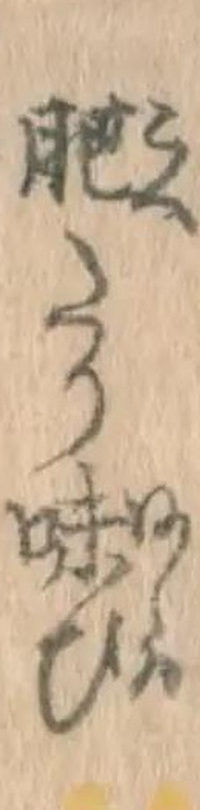肥たり味ひ
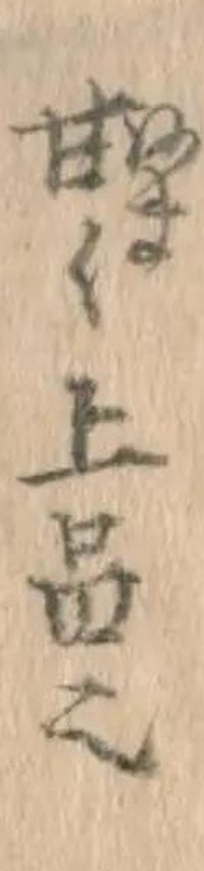甘く上品也

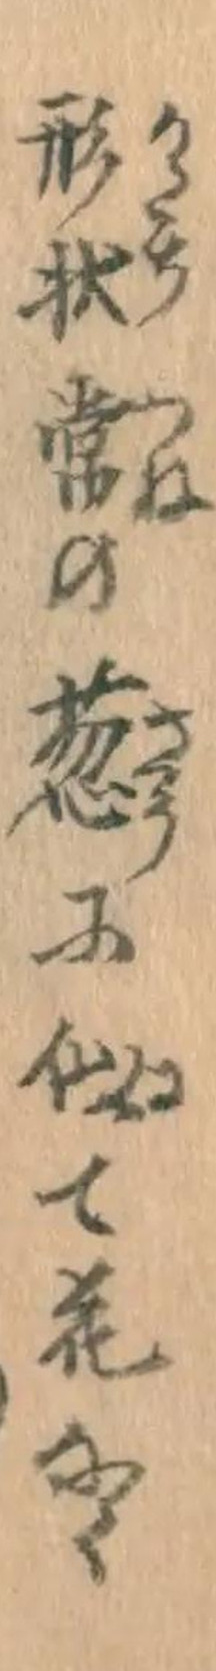形状常の葱に似て花なく
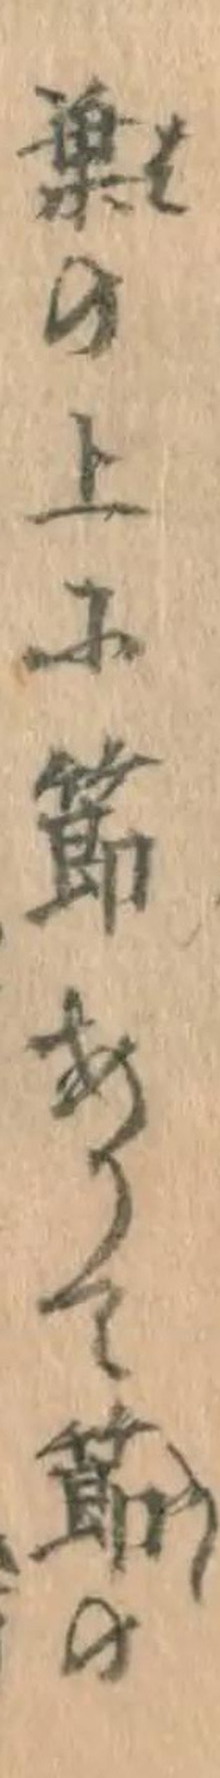葉の上に節ありて節の
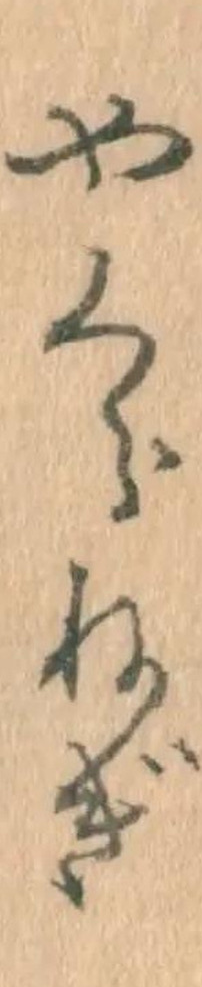やくらねぎ
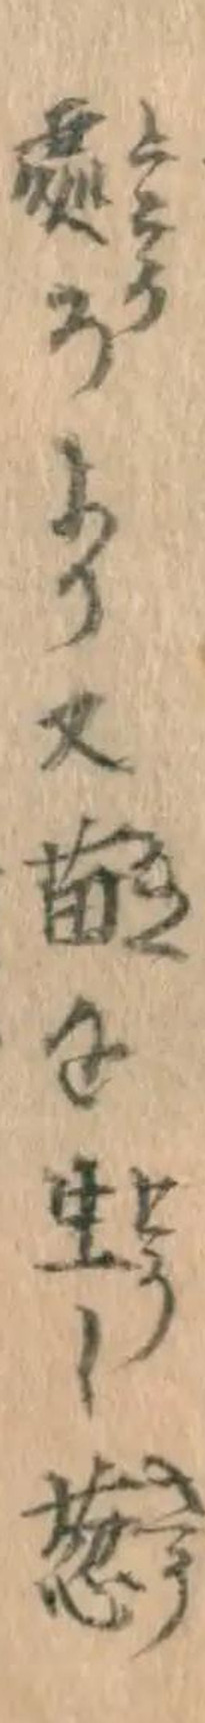処ろより又苗を生し葱
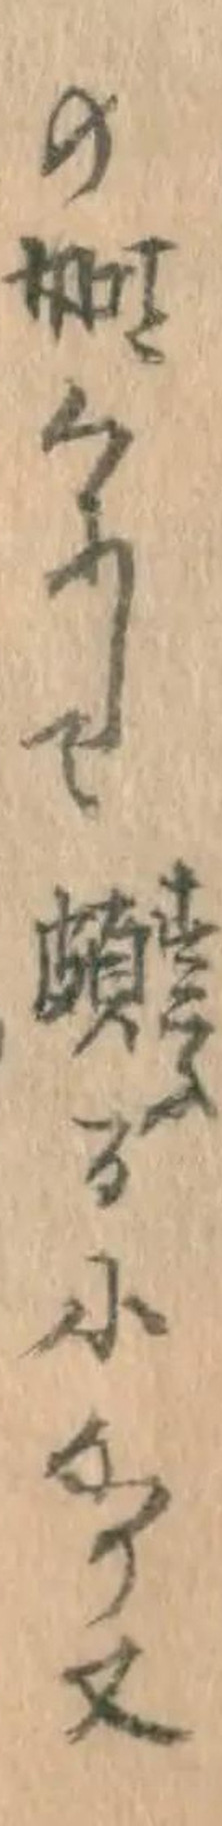の如くにして頗る小なり又
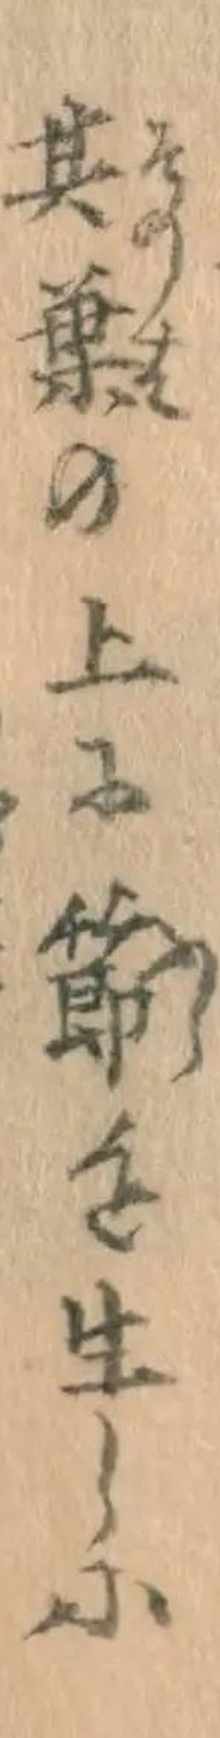其葉の上に節を生し小
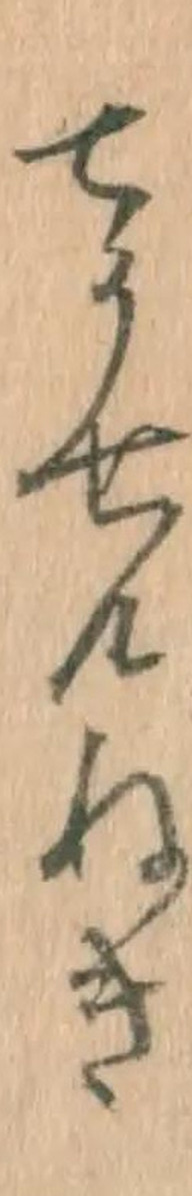てうせんねき
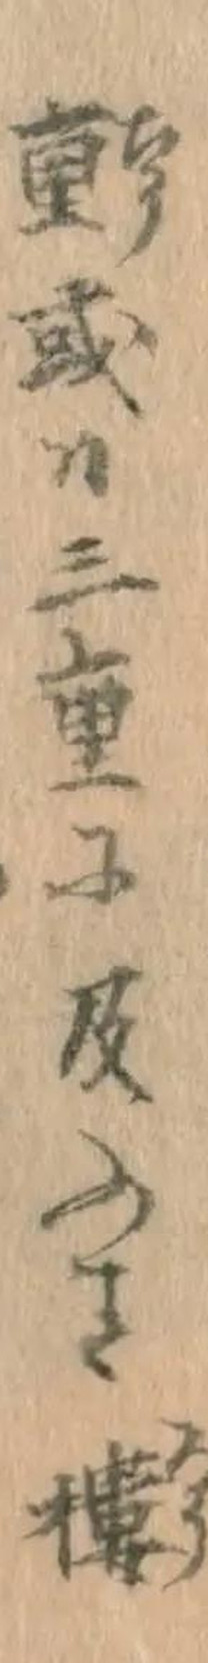重或は三重に及ふこと楼
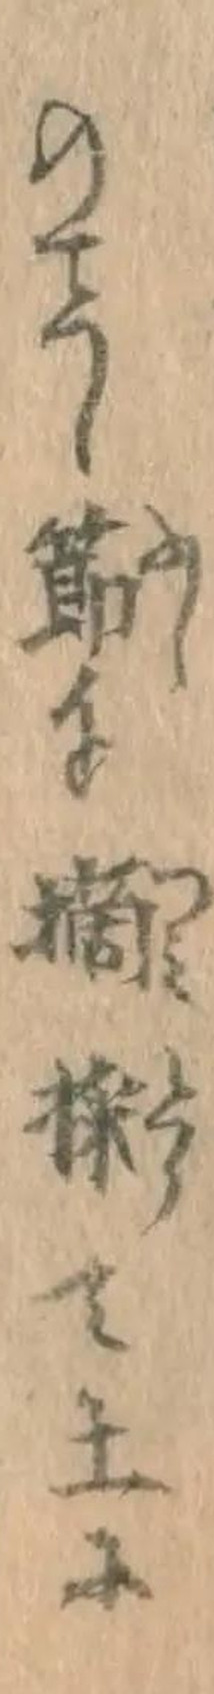のことし節を摘採て土に
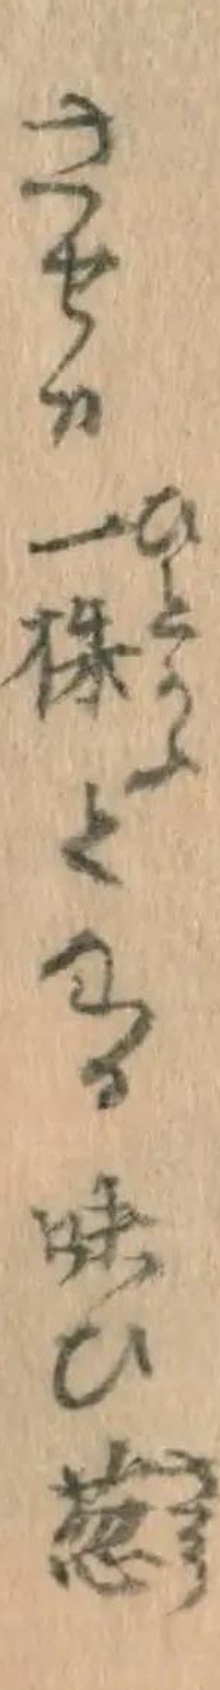させは一株となる味ひ葱
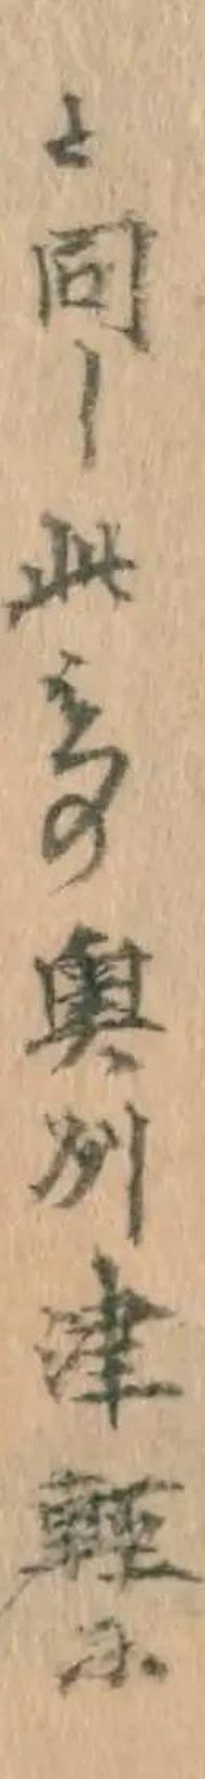と同し此もの奥州津軽に
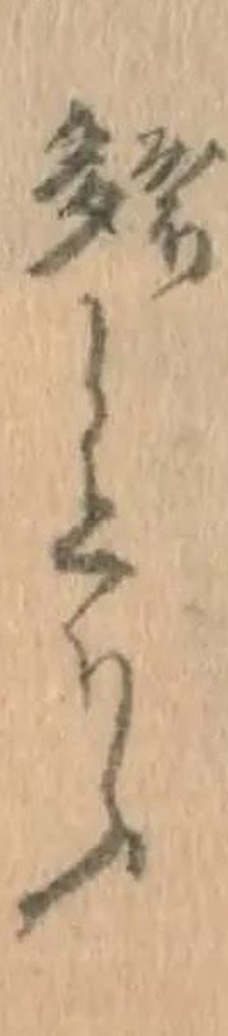多しといふ
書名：本草図譜. 巻43-45
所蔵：国立国会図書館 National Diet Library, JAPAN
